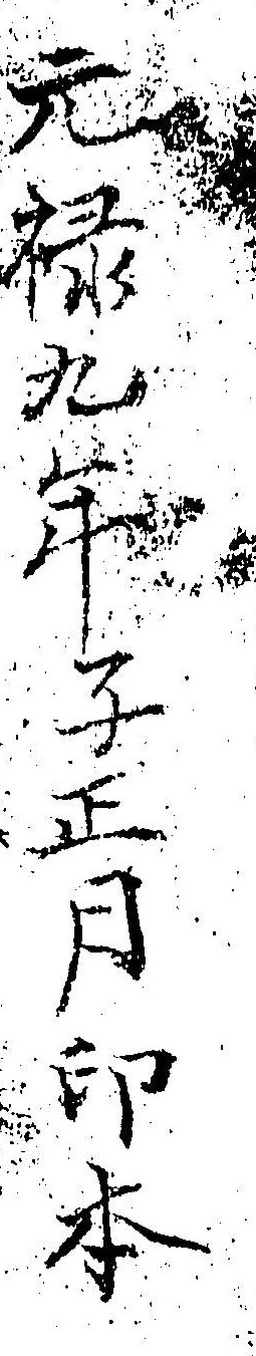元禄九年子正月印本
